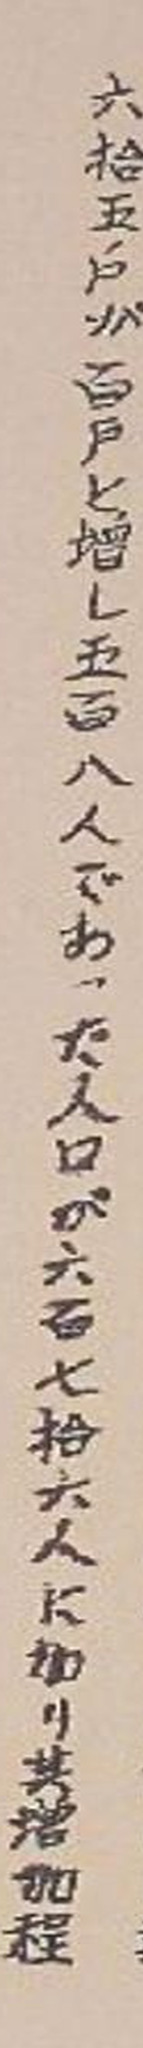六拾五戸が百戸と増し五百八人であった人口が六百七拾六人に加り其増加程
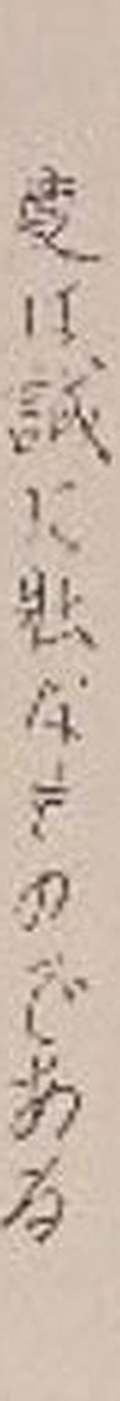度は誠に壮なものである
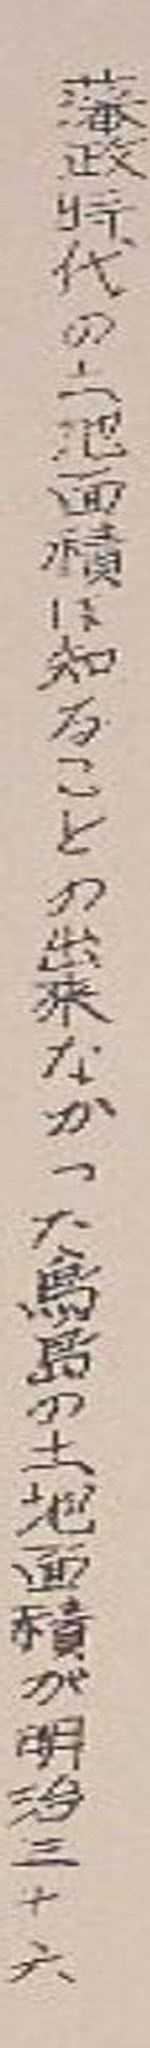藩政時代の土地面積は知ることの出来なかった鳥島の土地面積が明治三十六
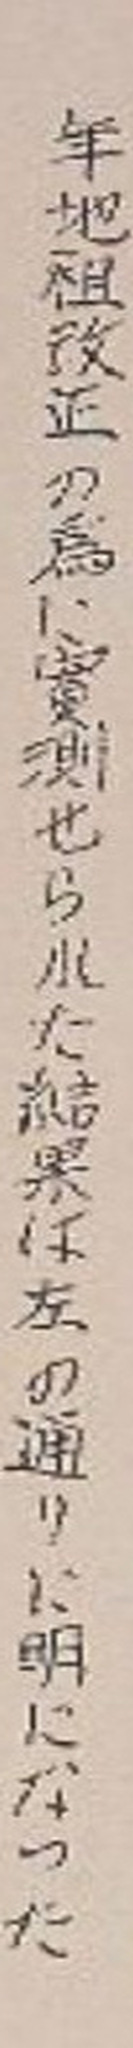年地租改正の為に実測せられた結果は左の通りに明になつた
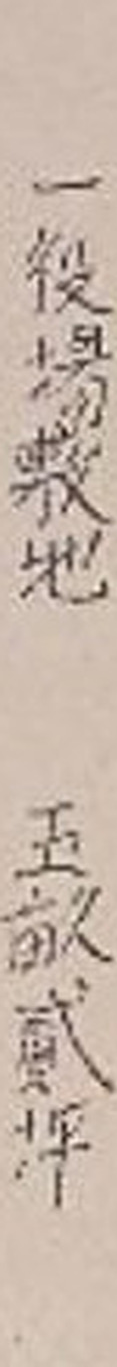一役場敷地五畝弐坪
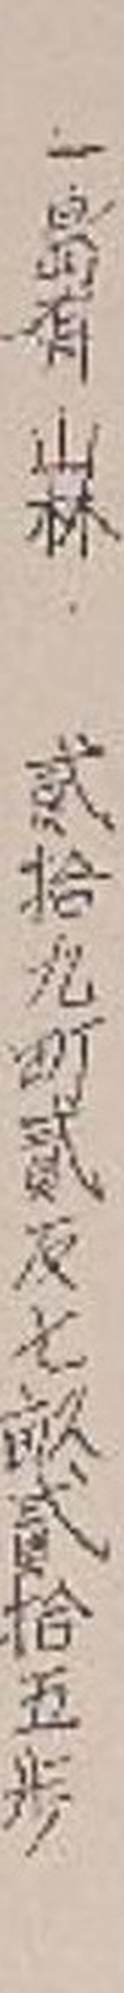一島有山林弐拾九町弐反七畝弐拾五歩
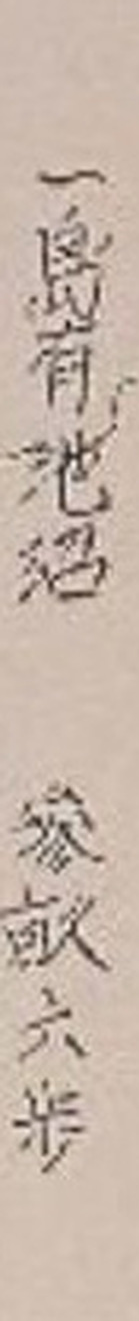一島有池沼参畝六歩
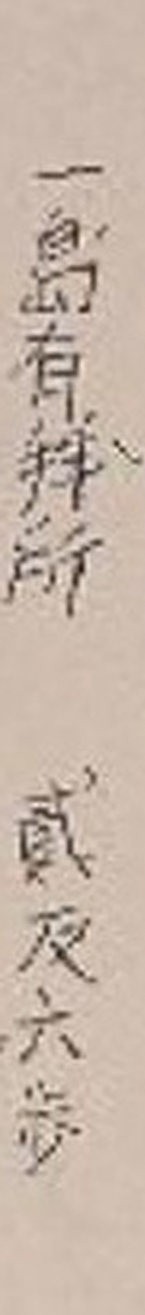一島有拝所弐反六歩
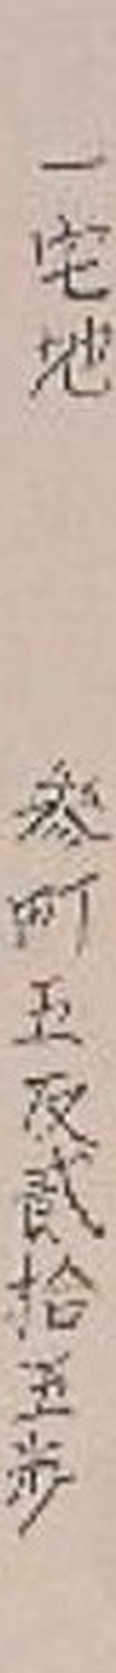一宅地参町五反弐拾五歩
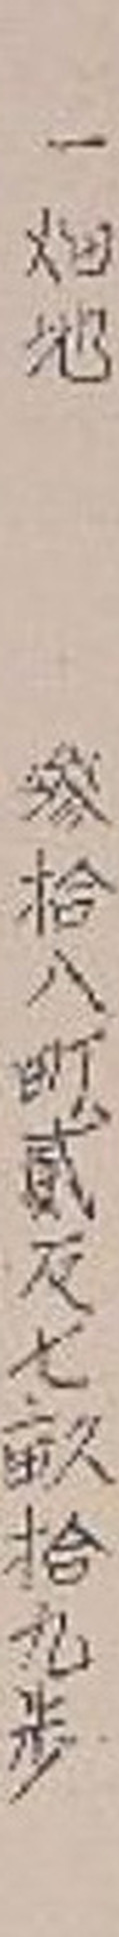一畑地参拾八町弐反七畝拾九歩
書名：鳥島移住始末
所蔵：University of the Ryukyus Library
